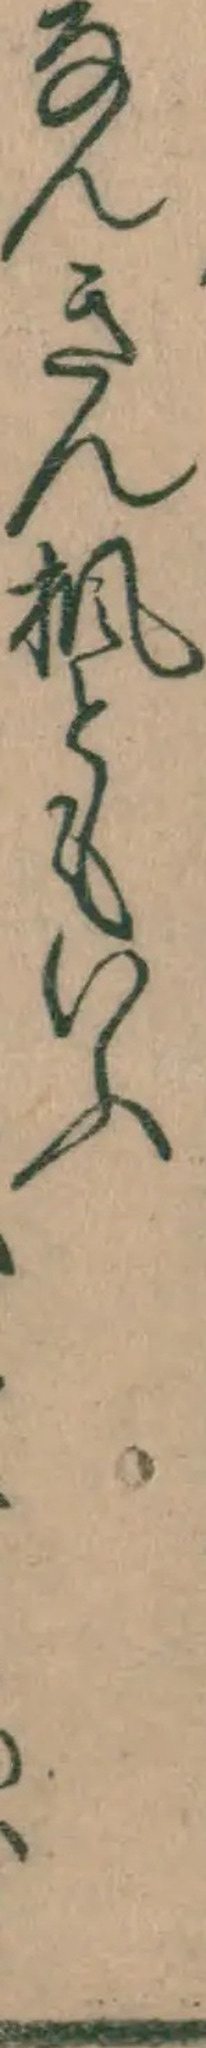なんきん楓ともいふ
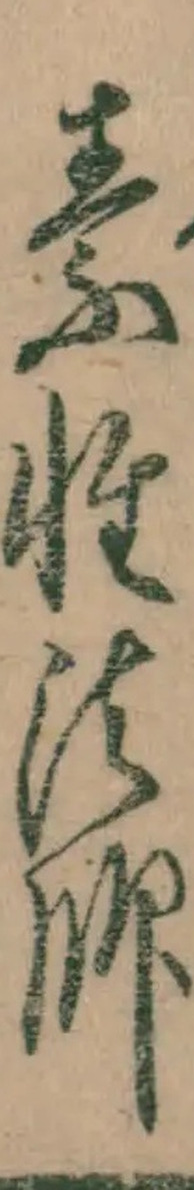素性法師
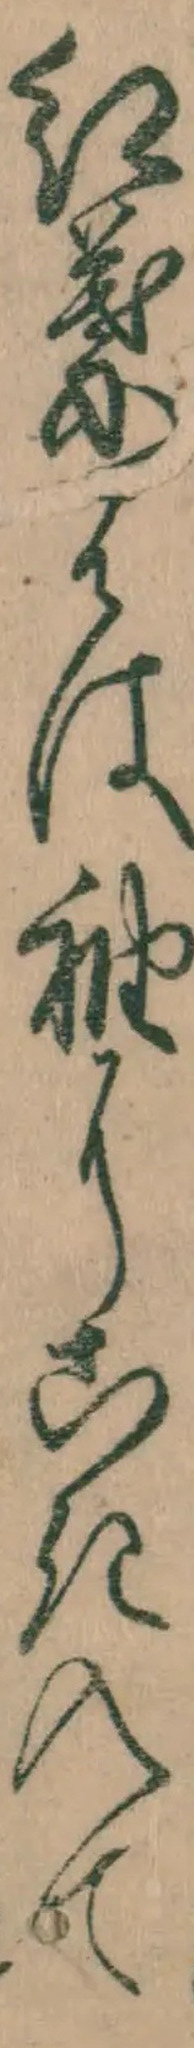紅葉はは袖にこき入て
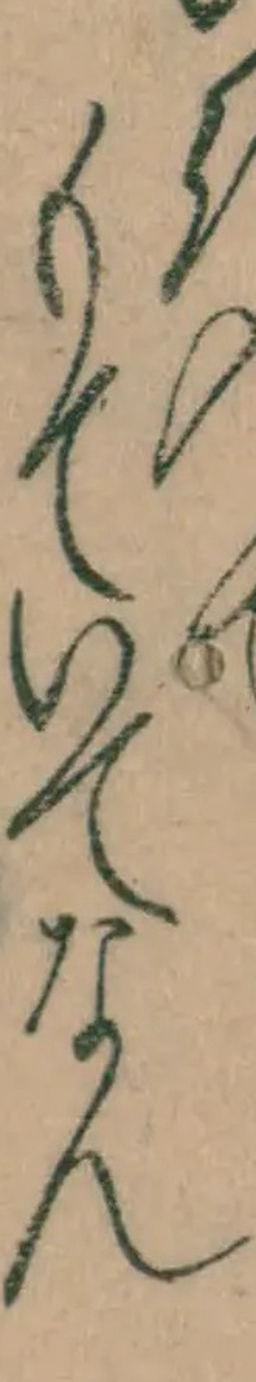もていてなん
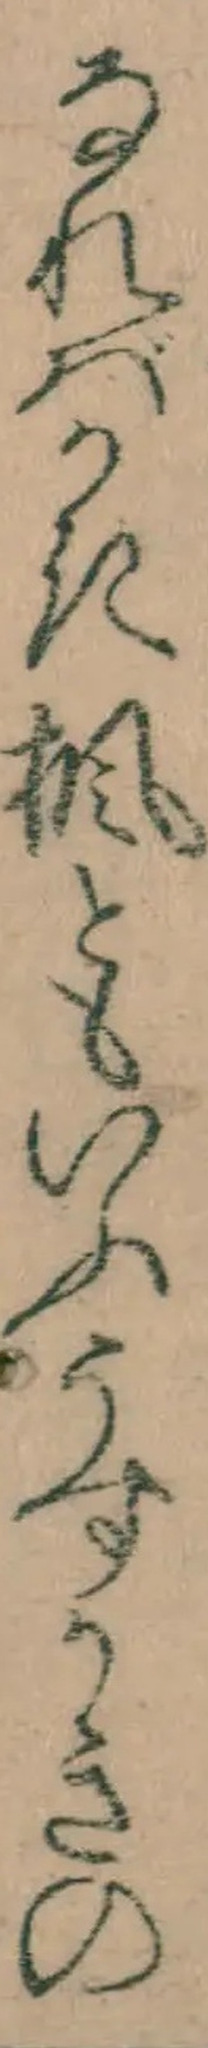なればかき楓ともいふうすかきの
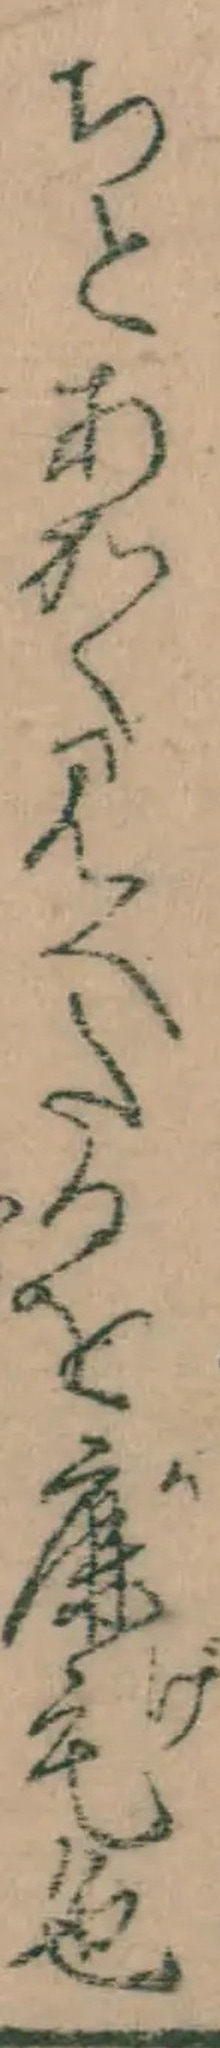ちとあかく見へたるを鹿毛色
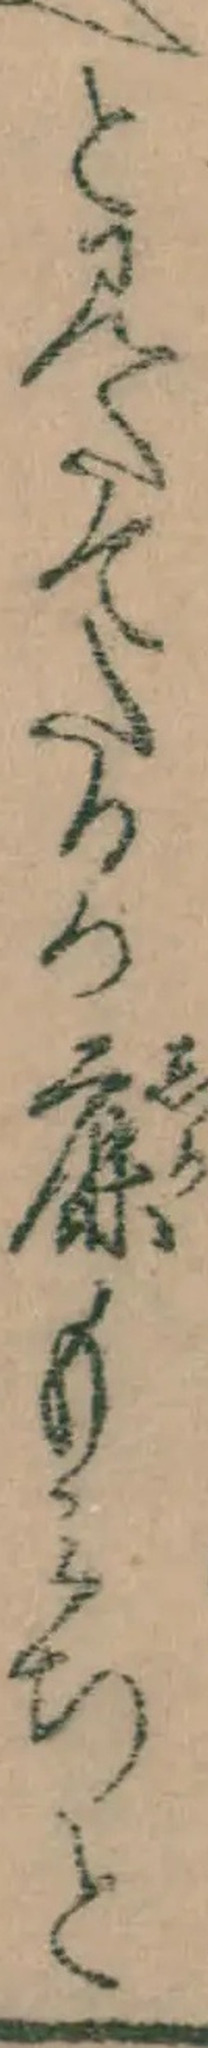と見たてたるか鹿もみちと
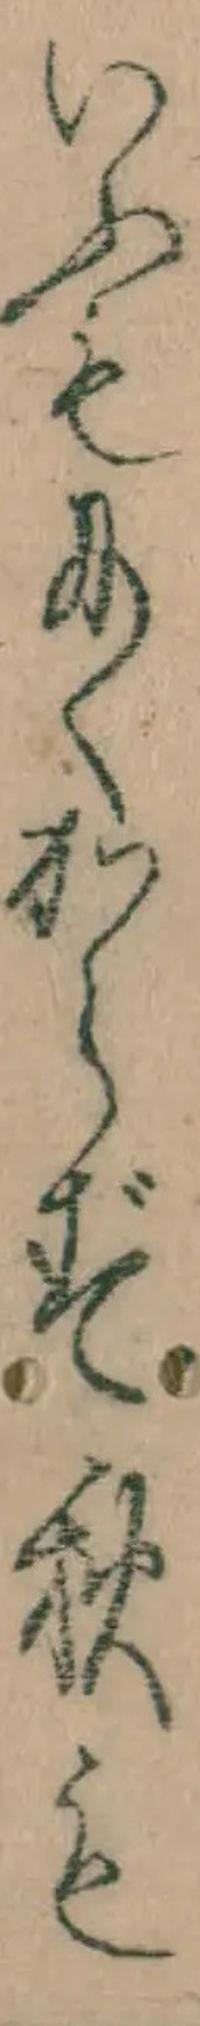いふもにくからず秋も
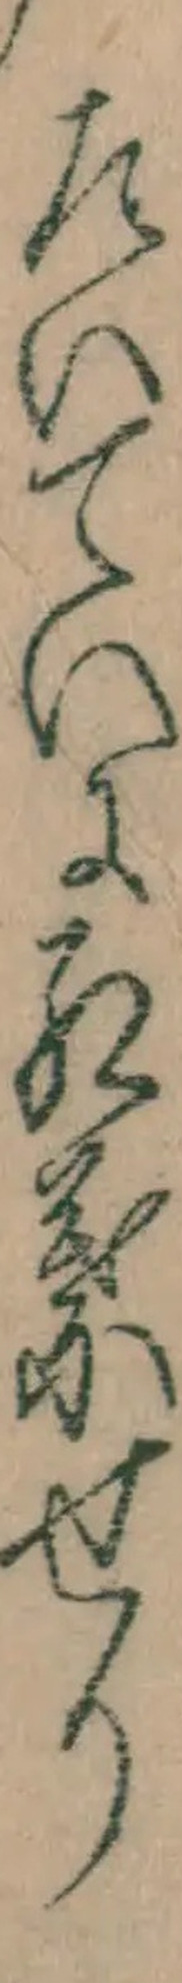たいていに紅葉せり
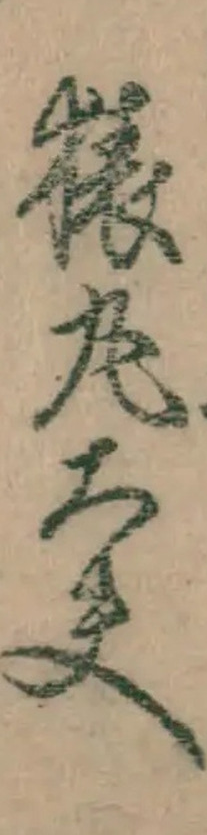猿丸大夫
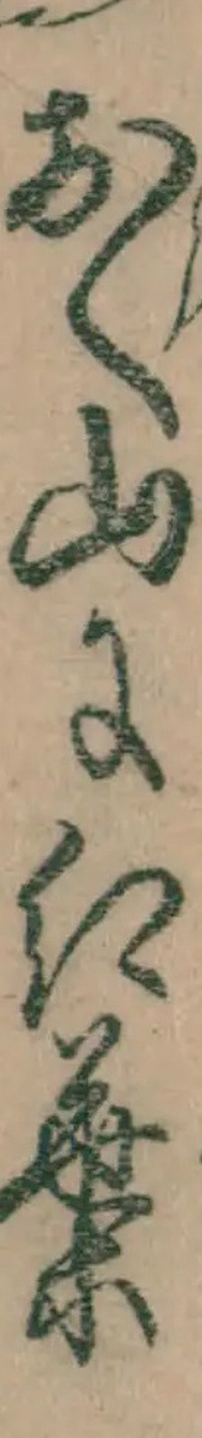おく山に紅葉
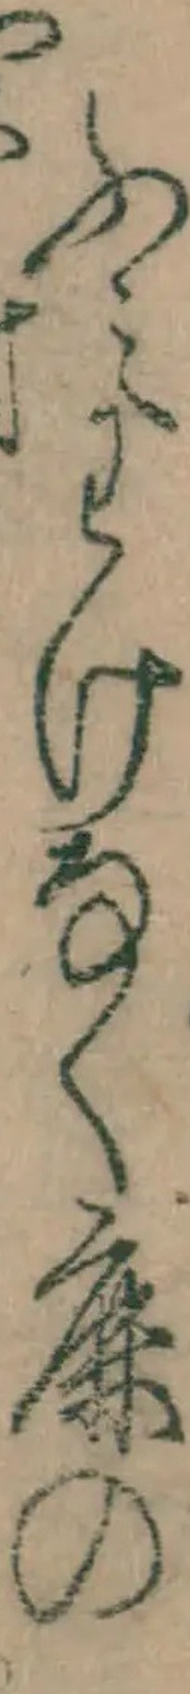ふみわけなく鹿の
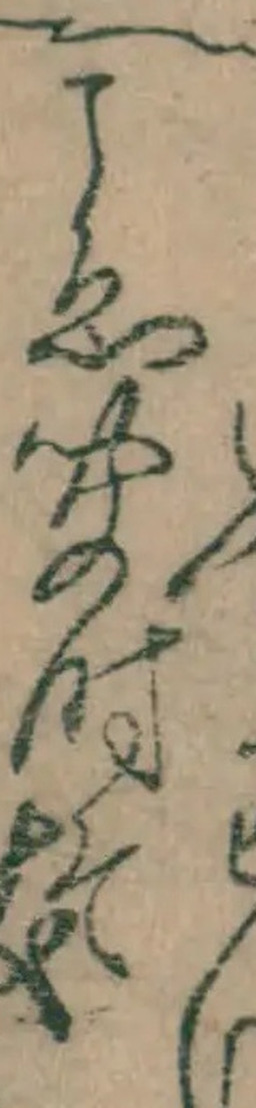こゑ聞時そ

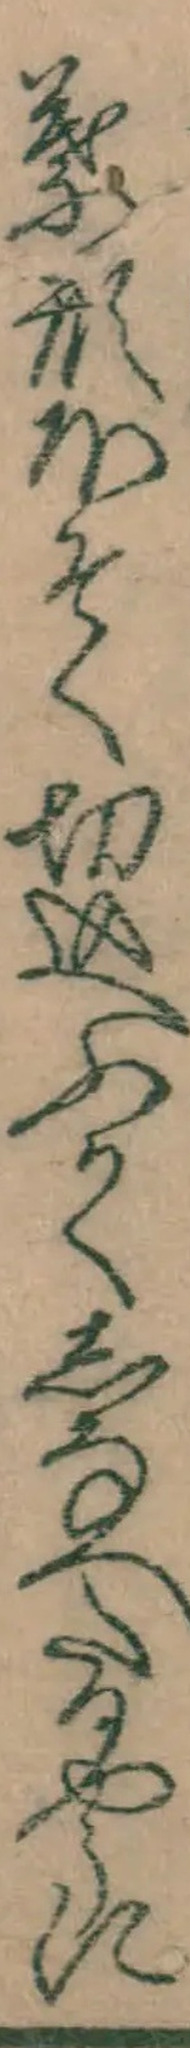葉形ほそく切込ふかくしなへたるやうに
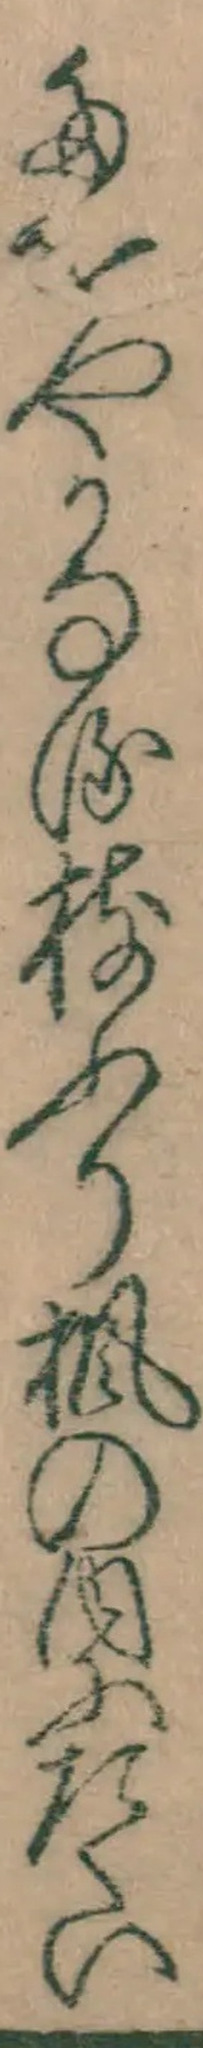たをやかなる枝ふり楓の内にたくい
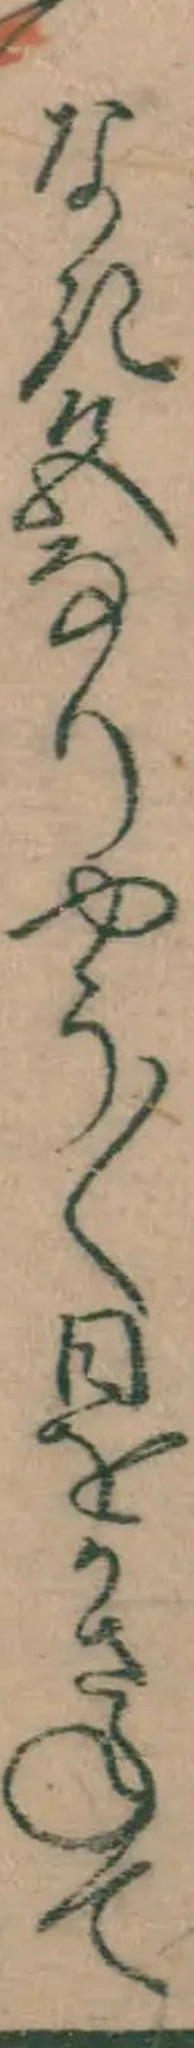なき色なりやう〳〵日をかさねて
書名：紅葉集
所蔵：国立国会図書館 National Diet Library, JAPAN
